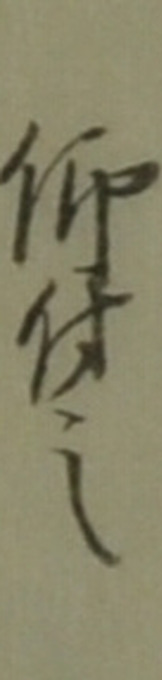仰付之
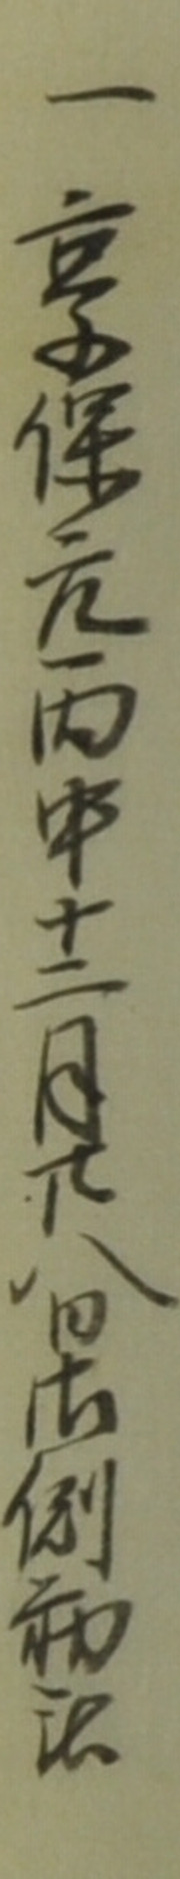一享保元丙申十二月廿八日御側勤被
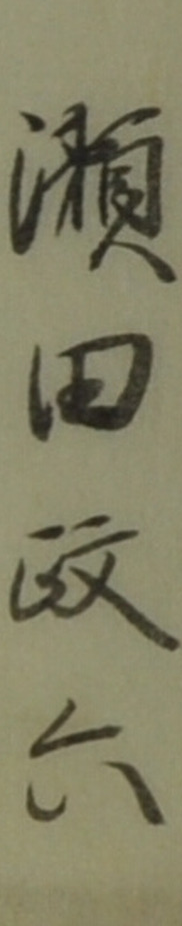瀬田政六

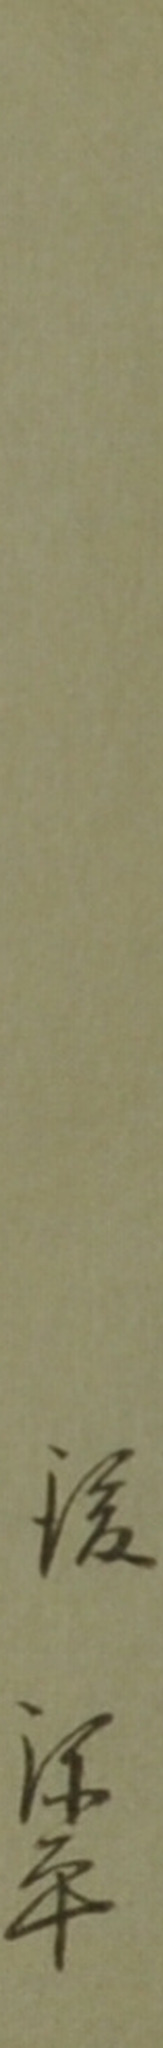後弥平
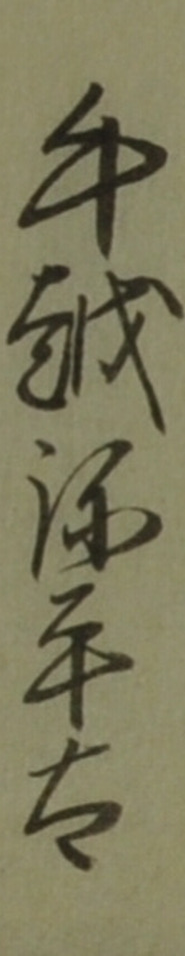牛越弥平太
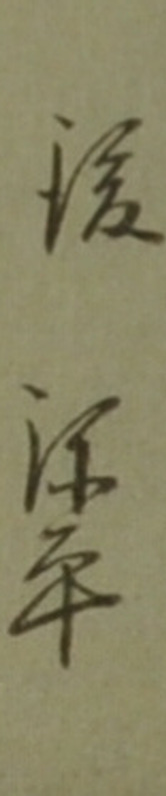後弥平
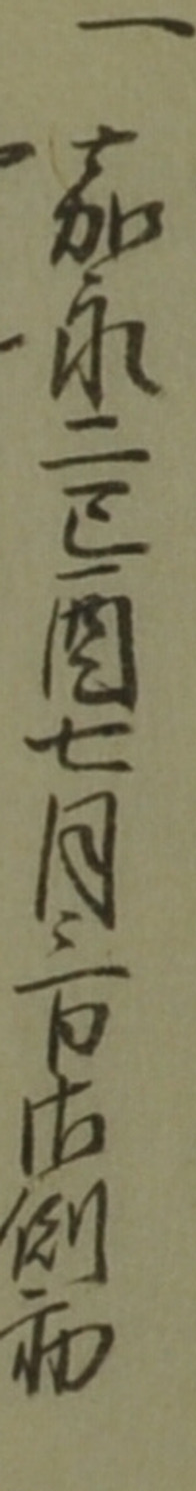一嘉永二己酉七月三日御側勤
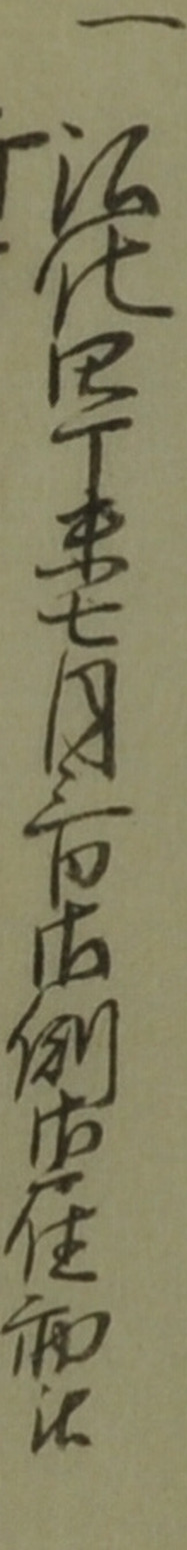一弘化四丁未七月三日御側御雇勤被
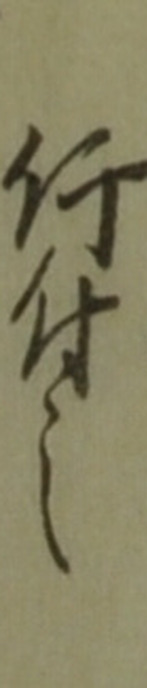仰付之
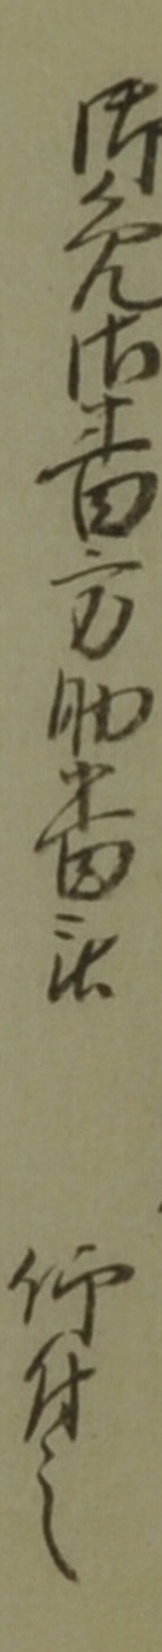御免御番方助番被仰付之
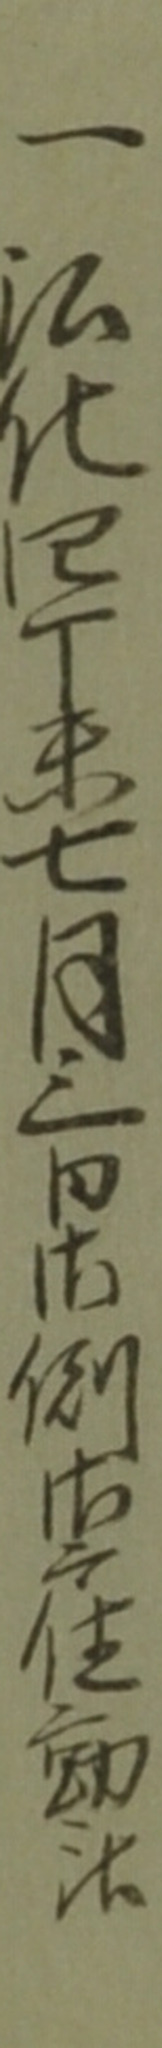一弘化四丁未七月三日御側御雇勤被
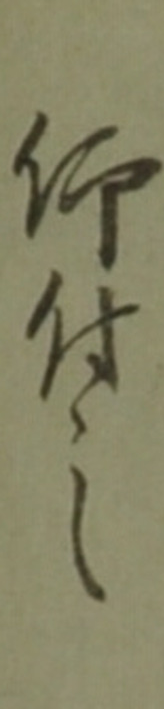仰付之
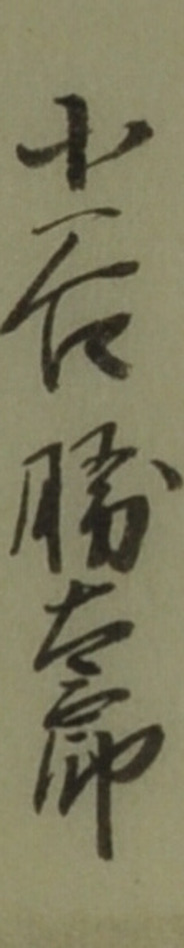小谷勝太郎

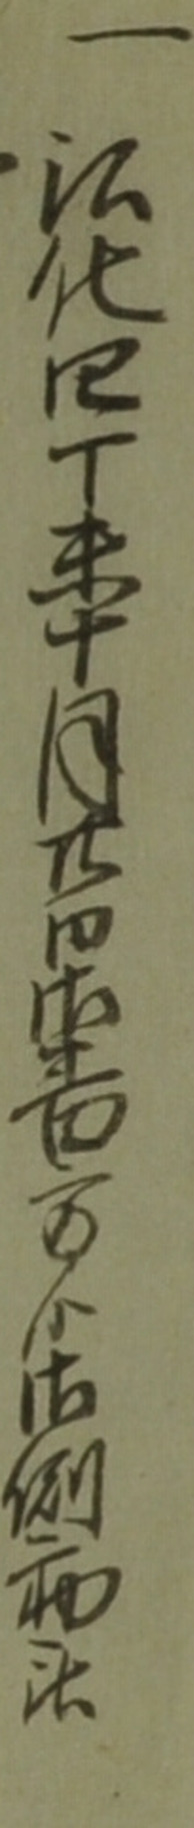一弘化四丁未十月廿日御番方ゟ御側勤被
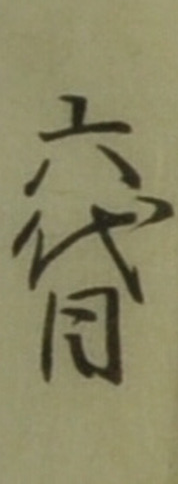六代目
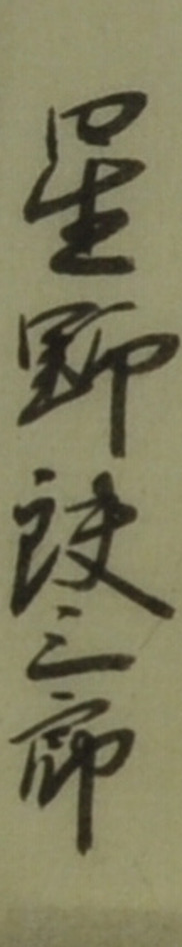星野鉄三郎
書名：諸御役代々録（五）
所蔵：伊那市立高遠町図書館・合同会社AMANE
